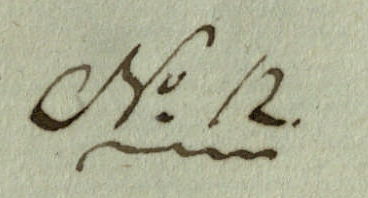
Nº 12.
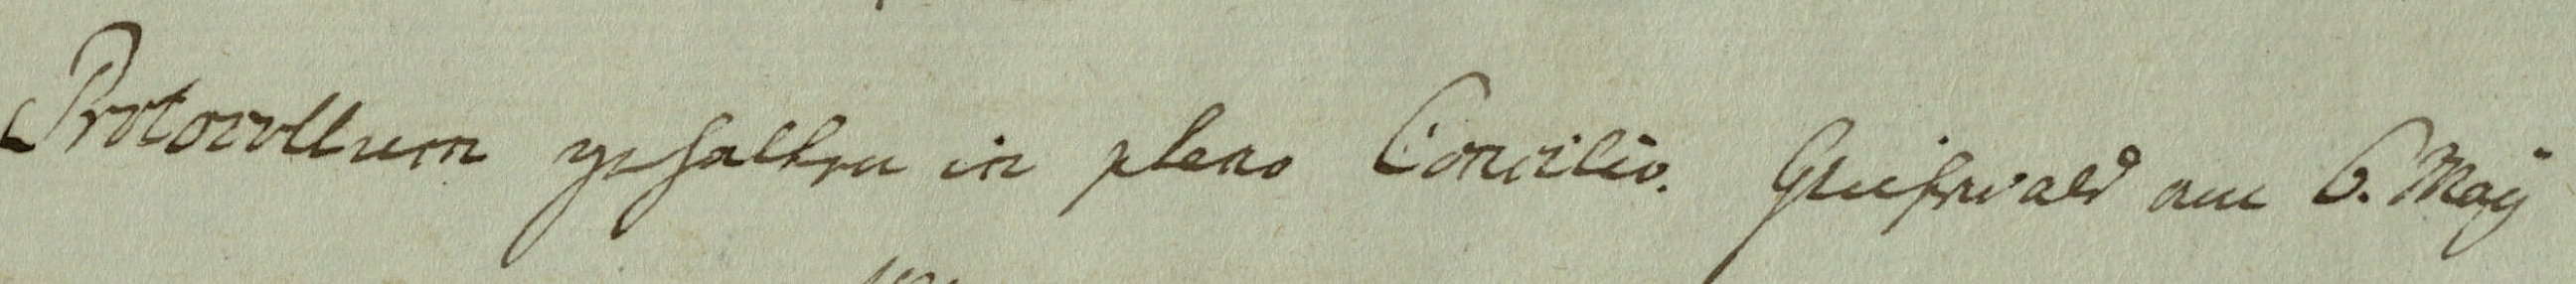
Protocollum gehalten in pleno Concilio. Greifswald am 6. Maÿ
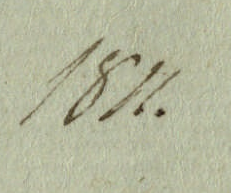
1811.
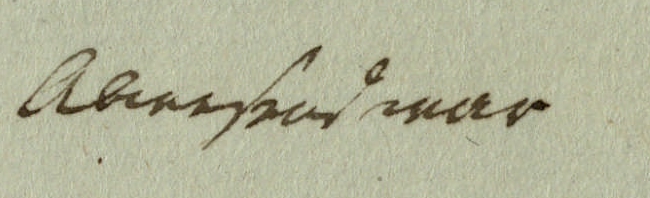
Abwesend war
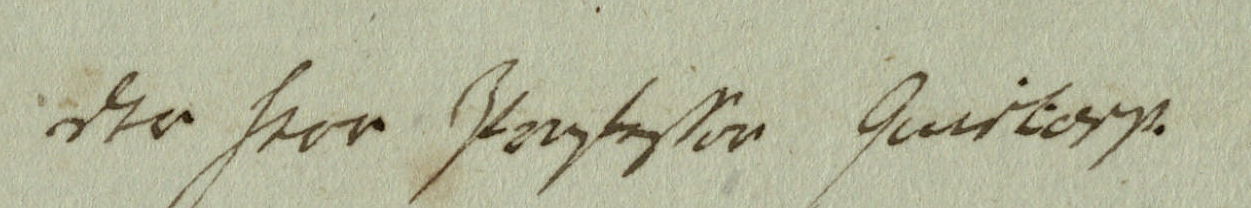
der Herr Professor Quistorp.
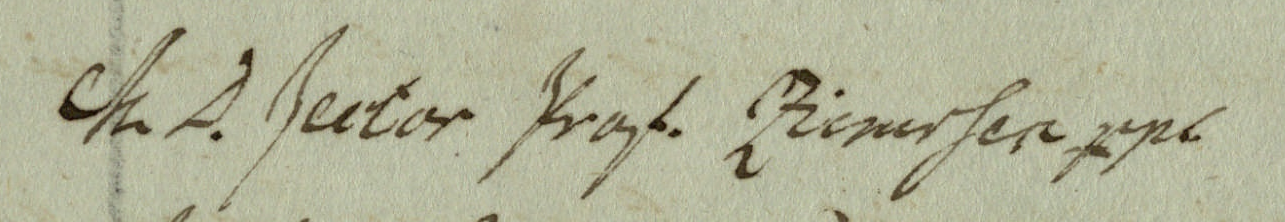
M. D. Rector Prof. Ziemssen ppt.
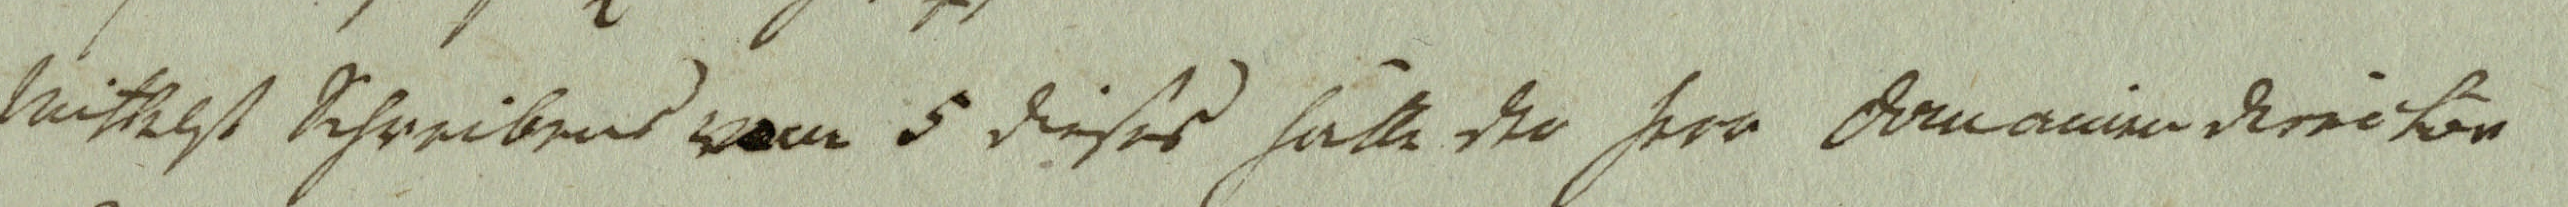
Mittelst Schreiben vom 5. dieses hätte der Herr Domainendirector
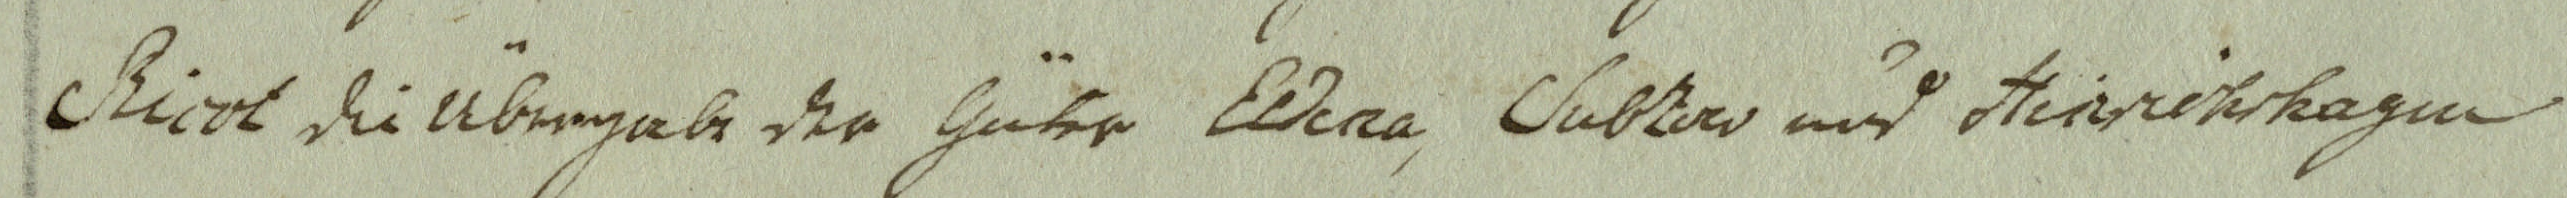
Ricot die Übergabe der Güter Eldena, Subzow und Hinrichshagen
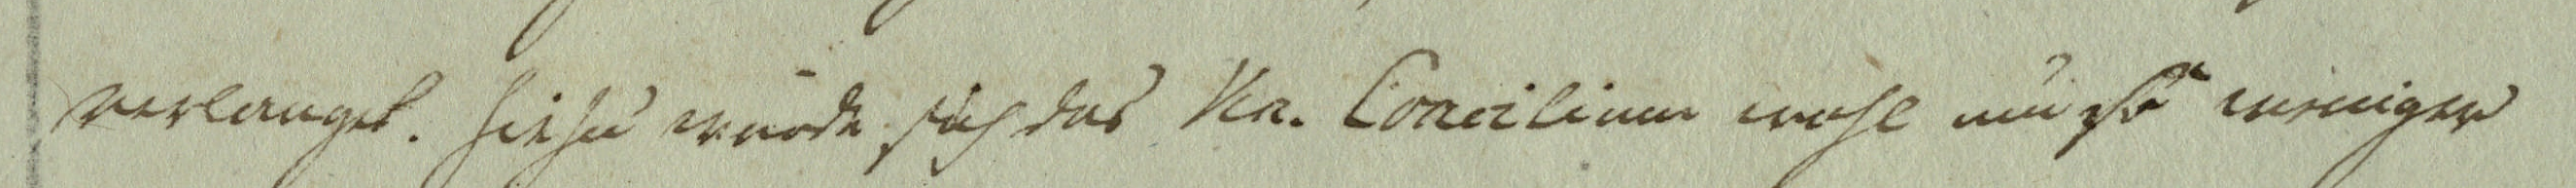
verlanget. Hiezu würde sich das Ven. Concilium wohl umso weniger
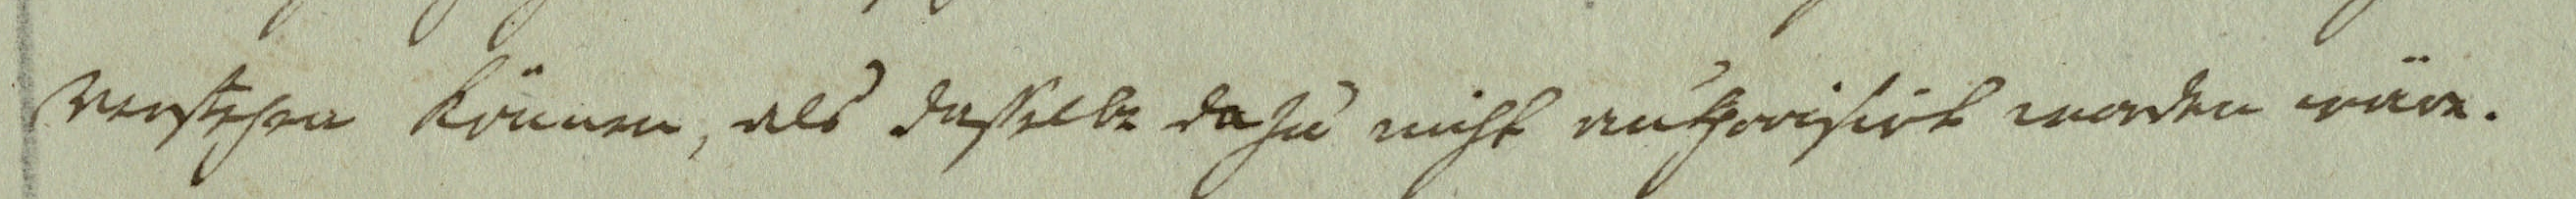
verstehen können, als dasselbe dazu nicht authorisirt worden wäre.
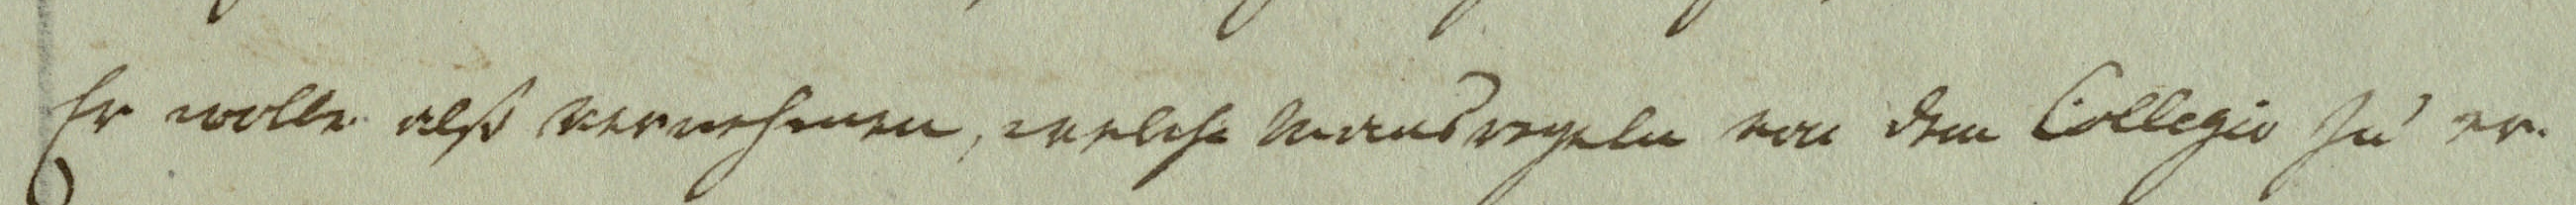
Er wolle also vernehmen, welche Maasregln von dem Collegii zu er¬
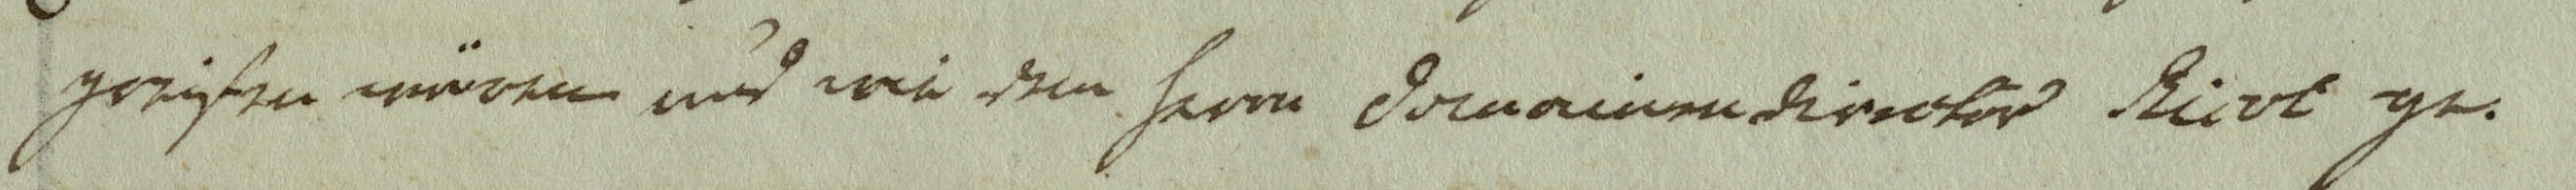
greifen wären und wie dem Herrn Domainendirector Ricot ge¬
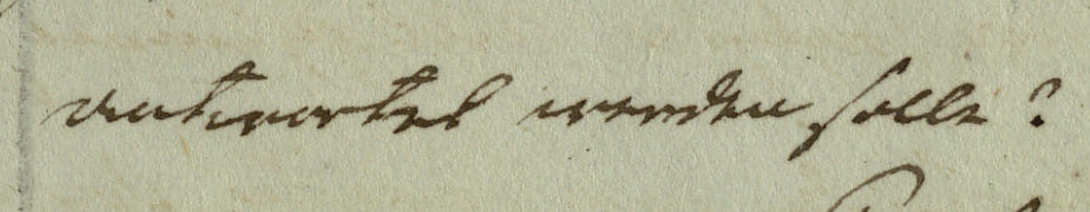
antwortet werden solle?
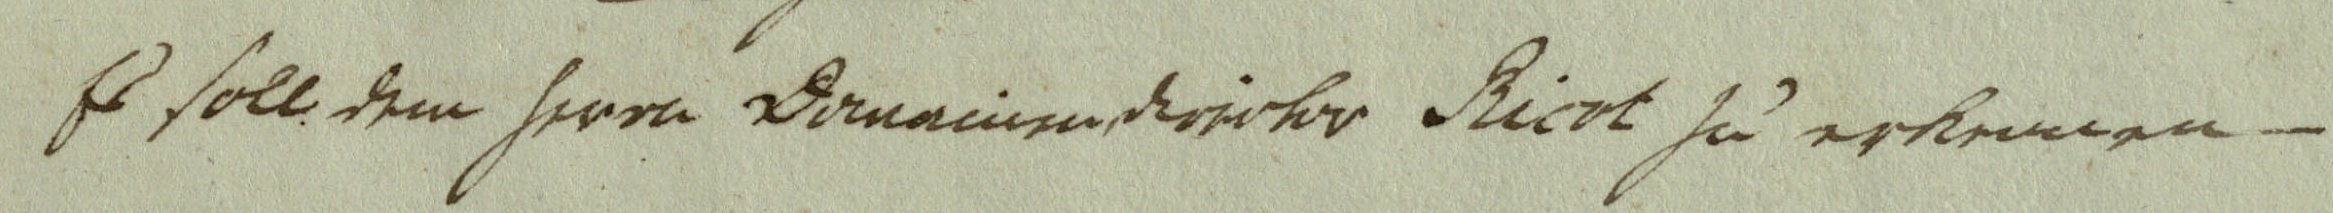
Es soll dem Herrn Domainendirector Ricot zu erkennen¬
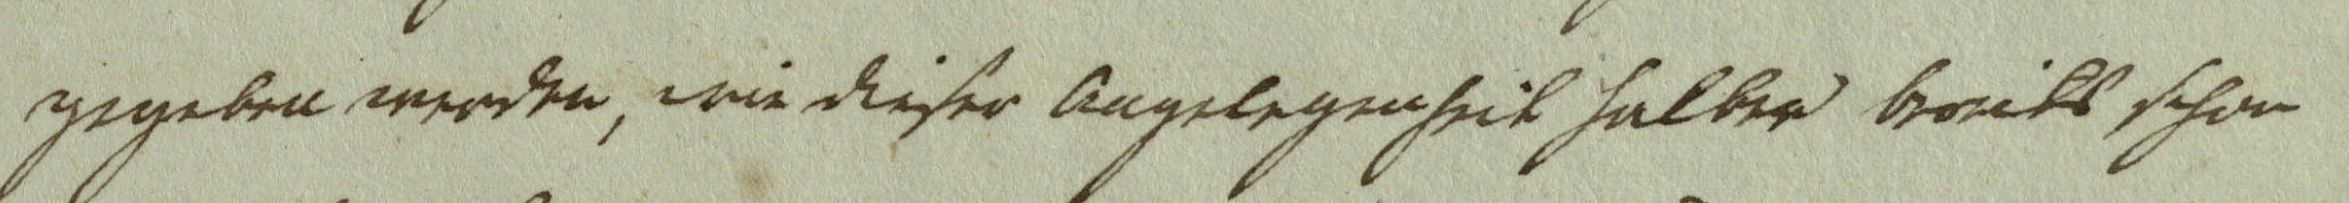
gegeben werden, wie dieser Angelegenheit halber bereits schon
